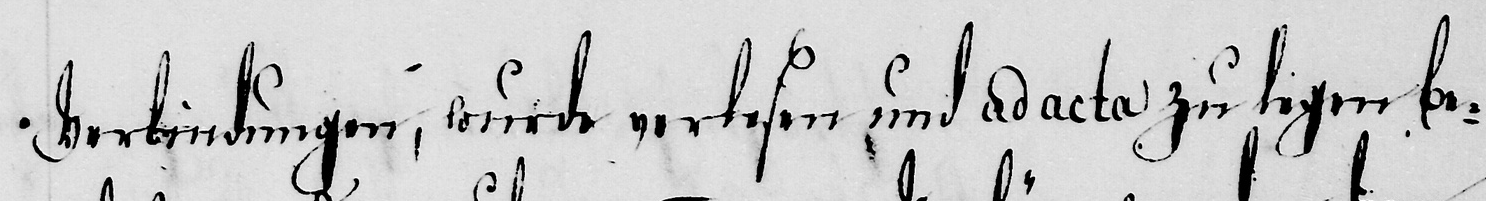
Verbindungen, wurde verlesen und ad acta zu legen be¬
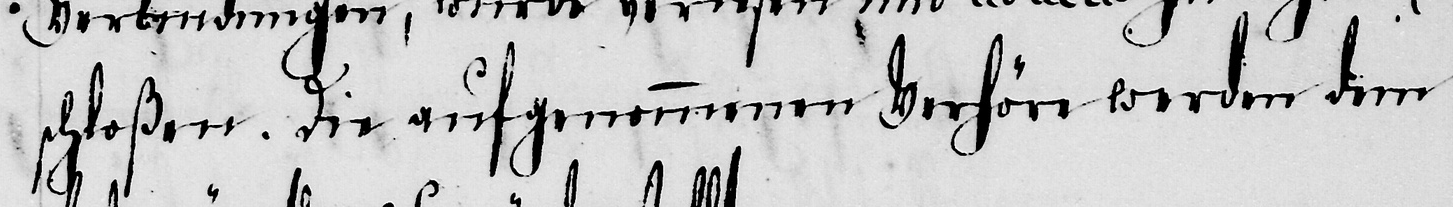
schloßen. Die aufgenommenen Verhöre werden dem
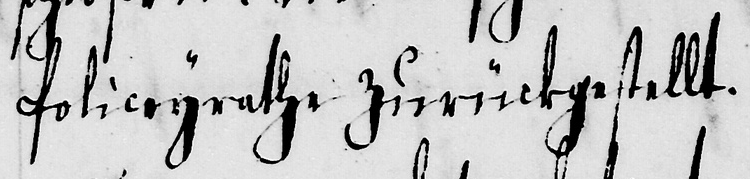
Policeyrathe zurückgestellt.
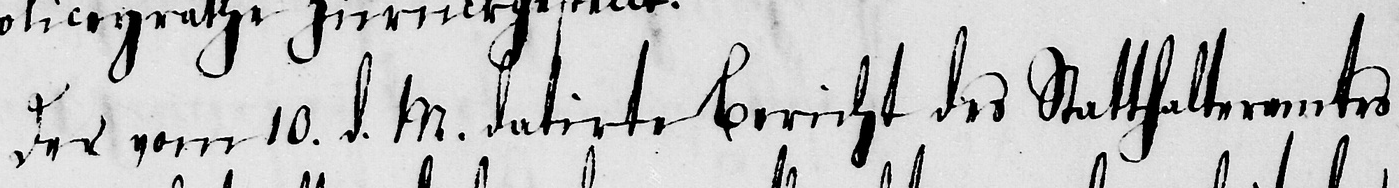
Der vom 10. d. M. datirte Bericht des Statthalteramtes
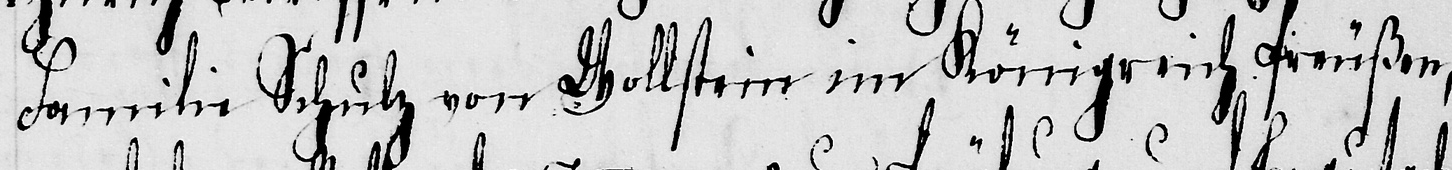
Familie Schulz von Wollstein im Königreich Preußen,
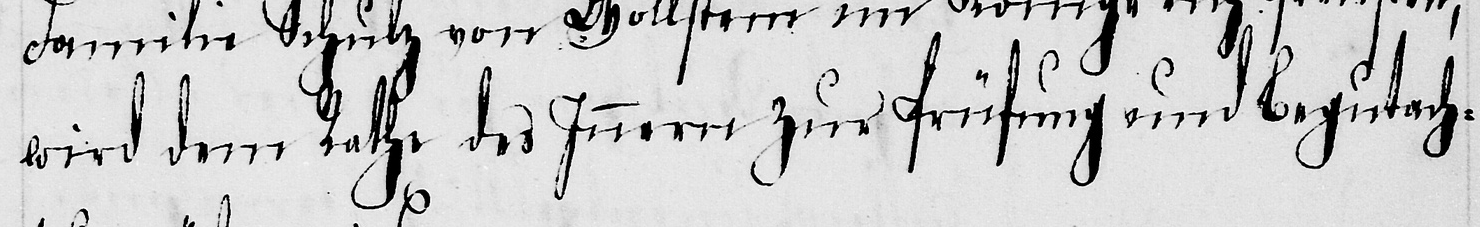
wird dem Rathe des Innern zur Prüfung und Begutach¬
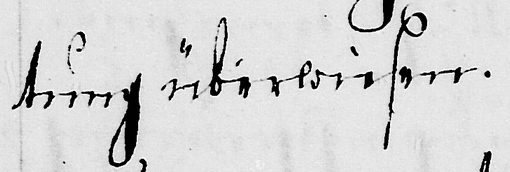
tung überwiesen.
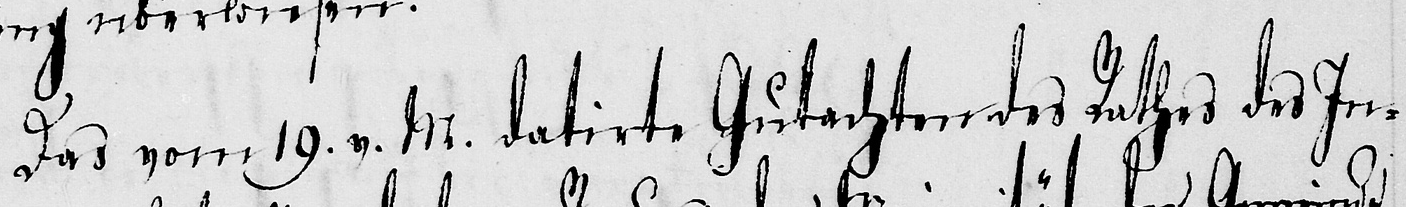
Das vom 19. v. M. datirte Gutachten des Rathes des In¬
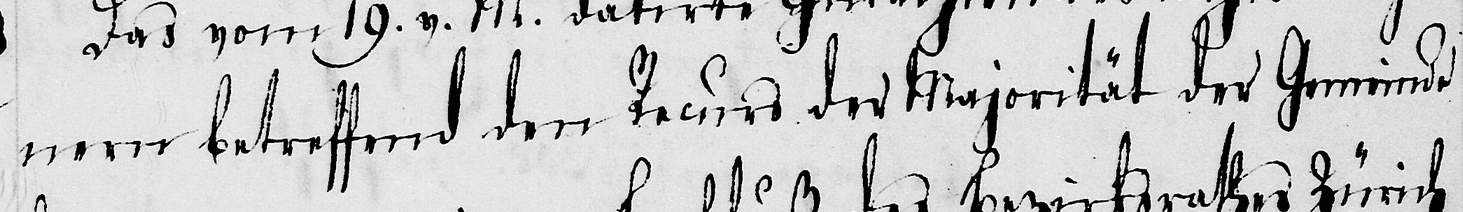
nern betreffend den Recurs der Majorität der Gemeinde
